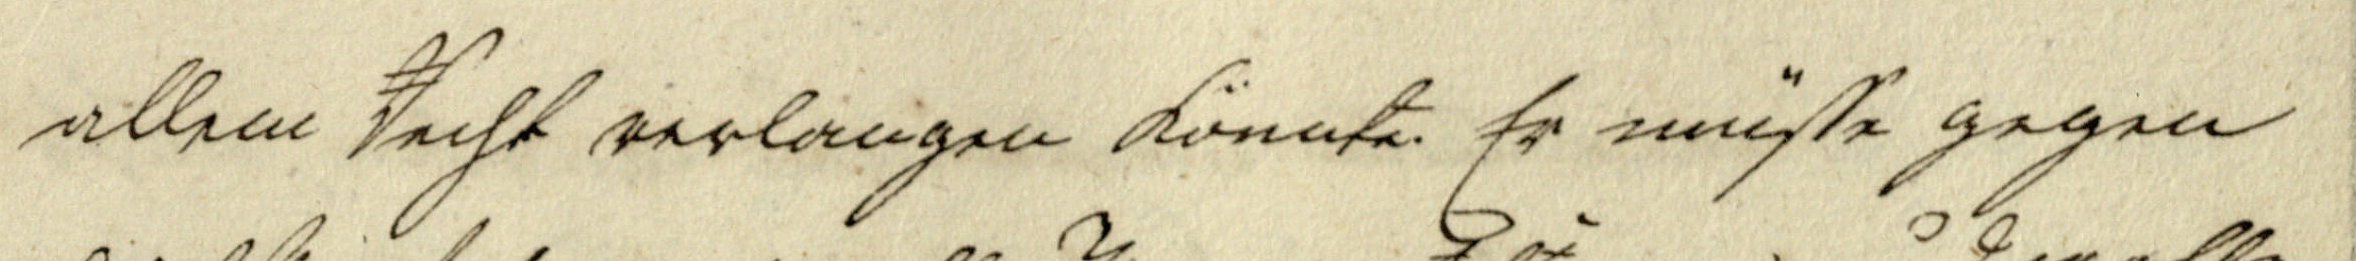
allem Recht verlangen könnte. Er müsse gegen
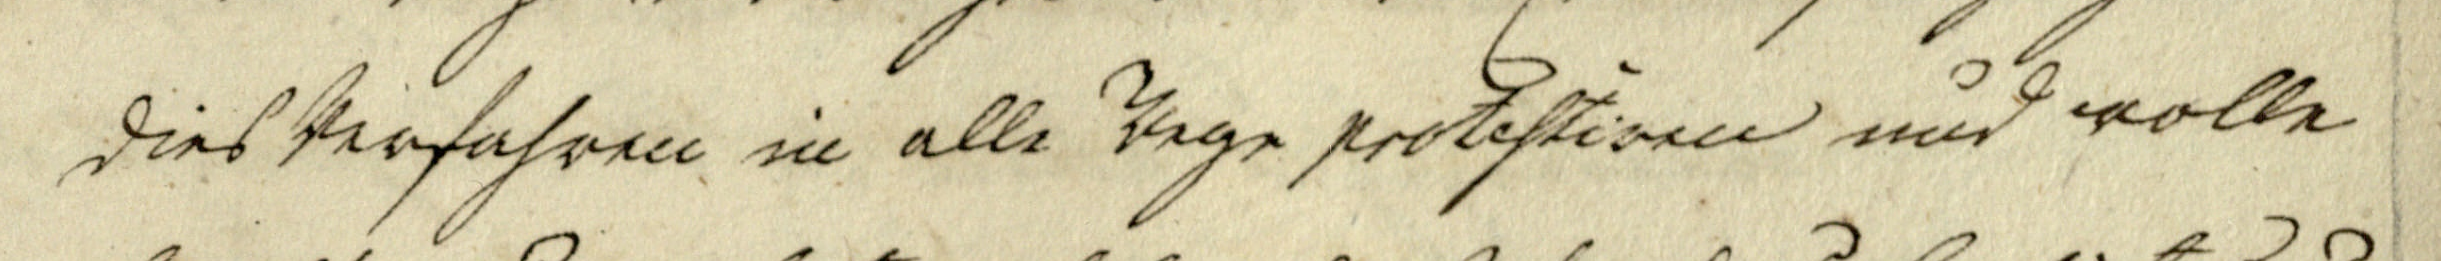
dies Verfahren in alle Wege protestiren und wolle
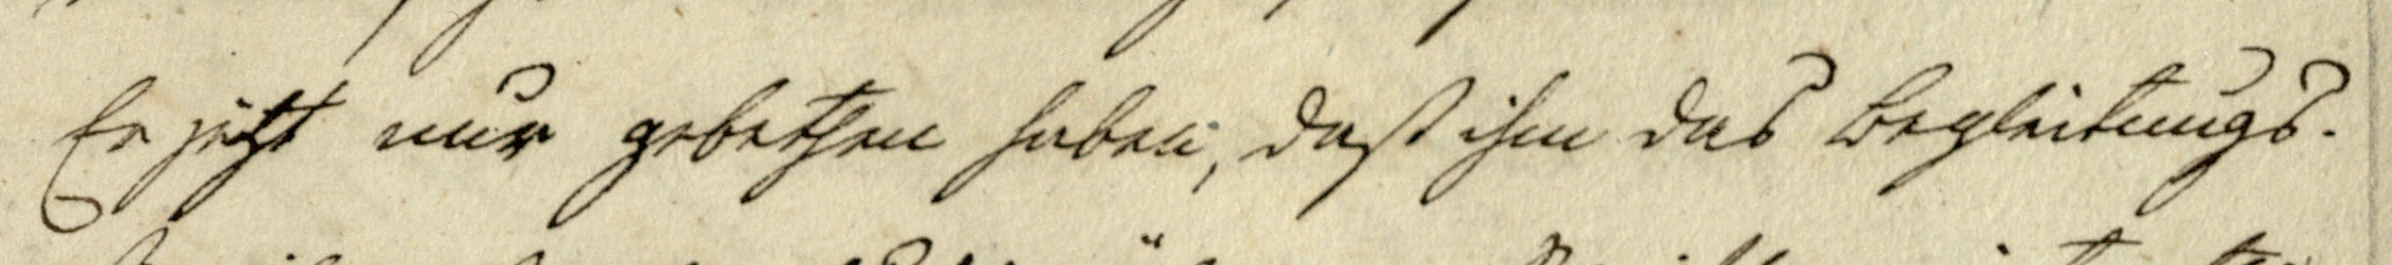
Er jetzt nur gebethen haben, daß ihm das Begleitungs¬
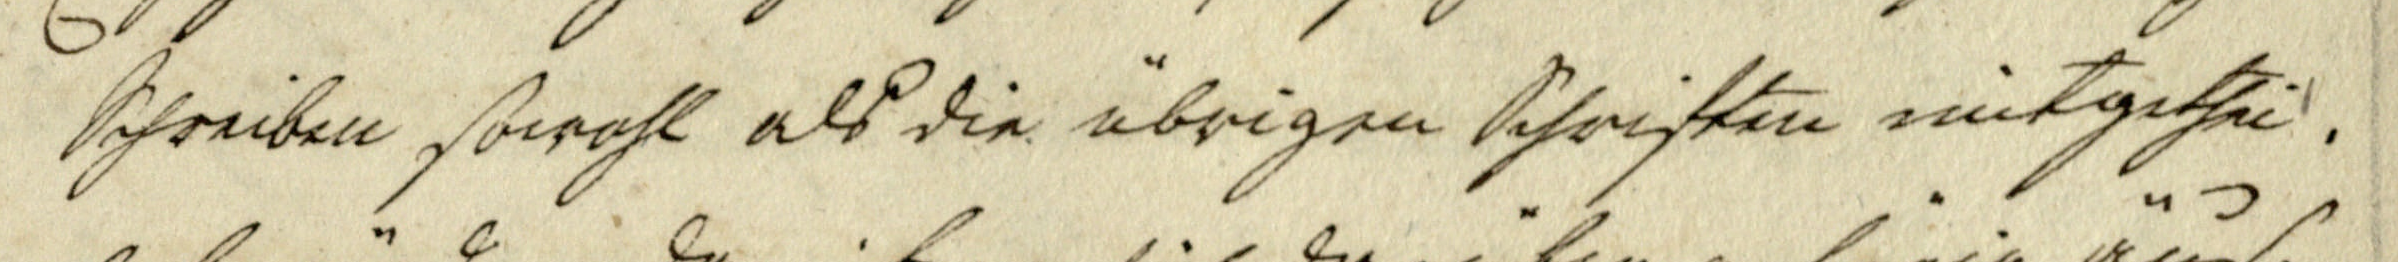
Schreiben sowohl als die übrigen Schriften mitgethei¬
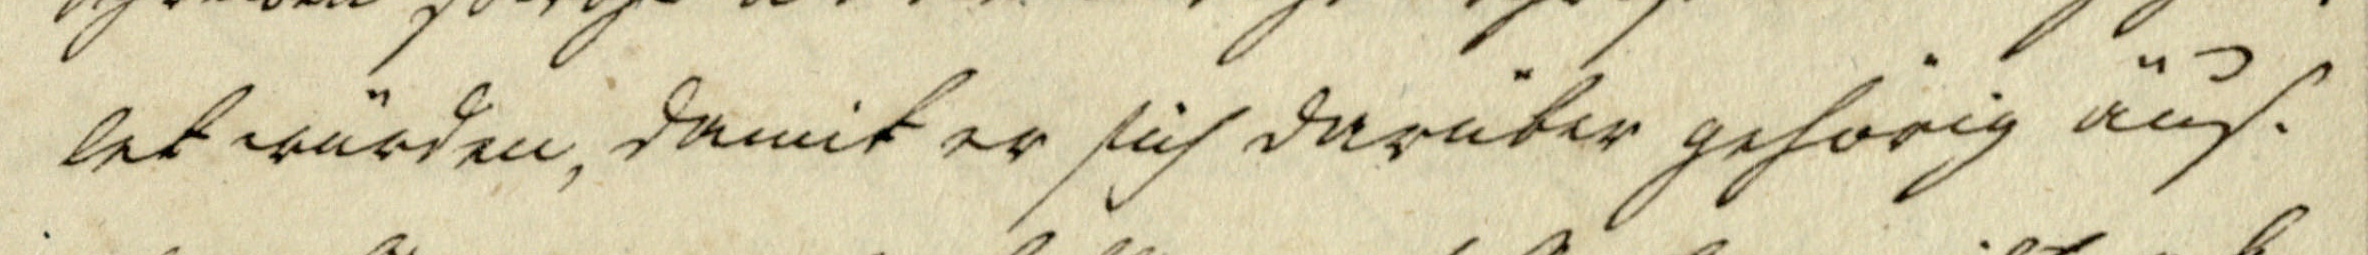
let würden, damit er sich darüber gehörig äus¬
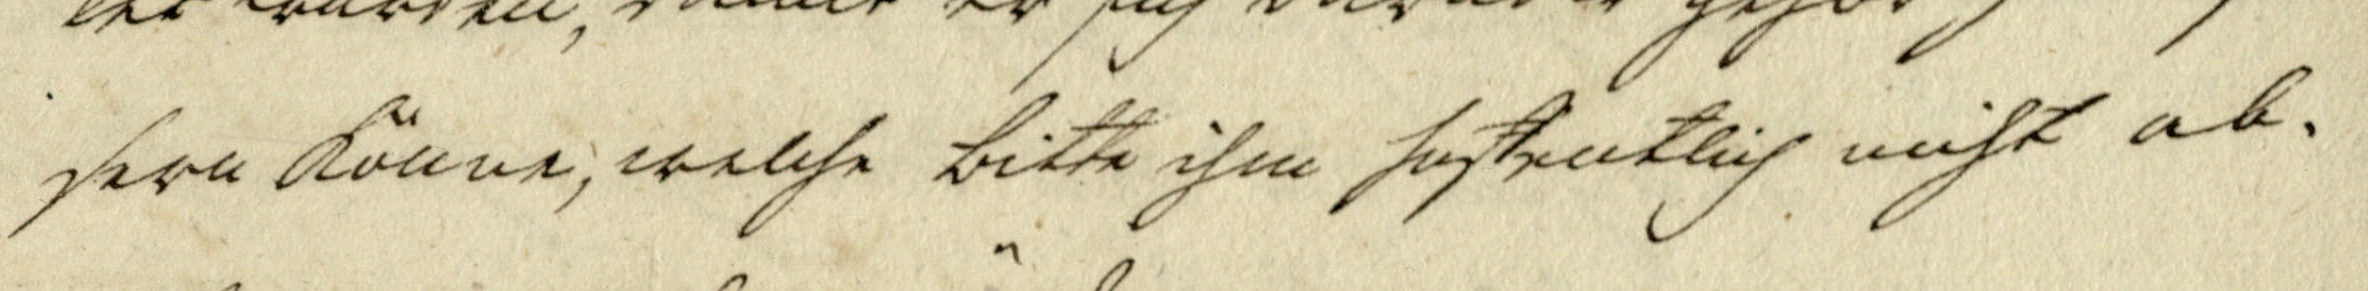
sern könne, welche Bitte ihm hoffentlich nicht ab¬
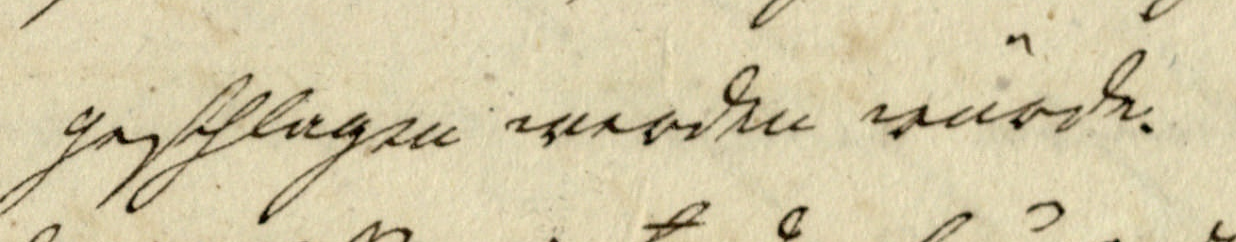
geschlagen werden würde.
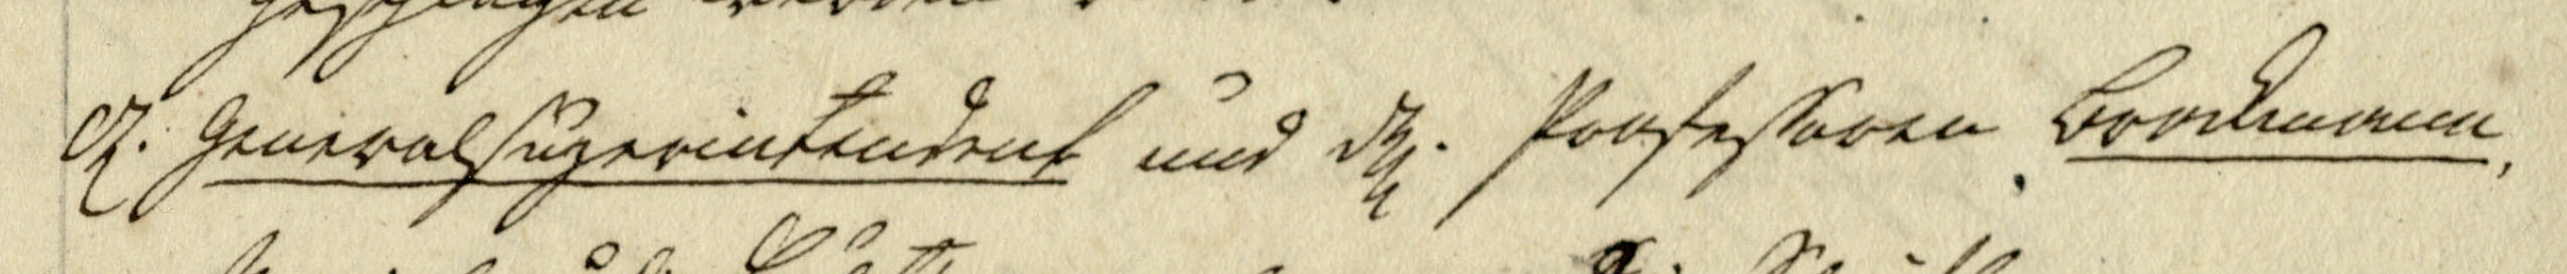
dh. Generalsuperintendent und dh. Professoren Brockmann,
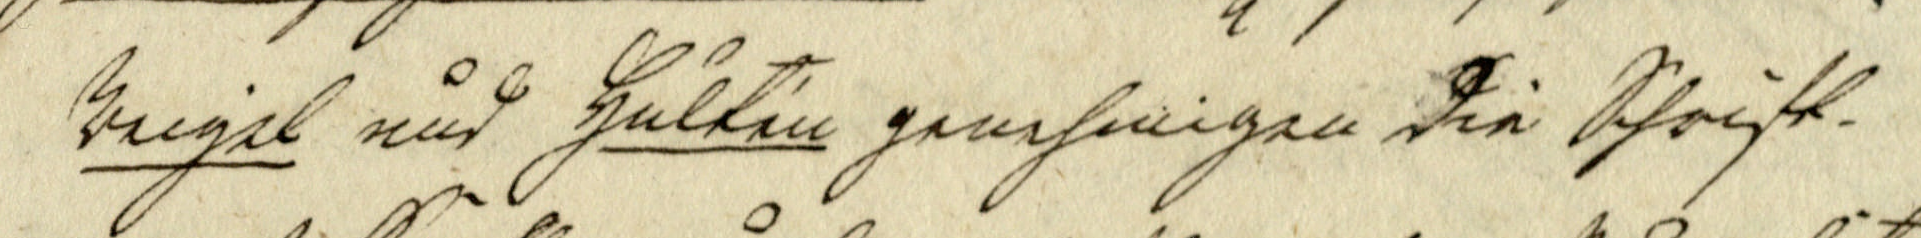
Weigel und Hultén genehmigen die Schrift.
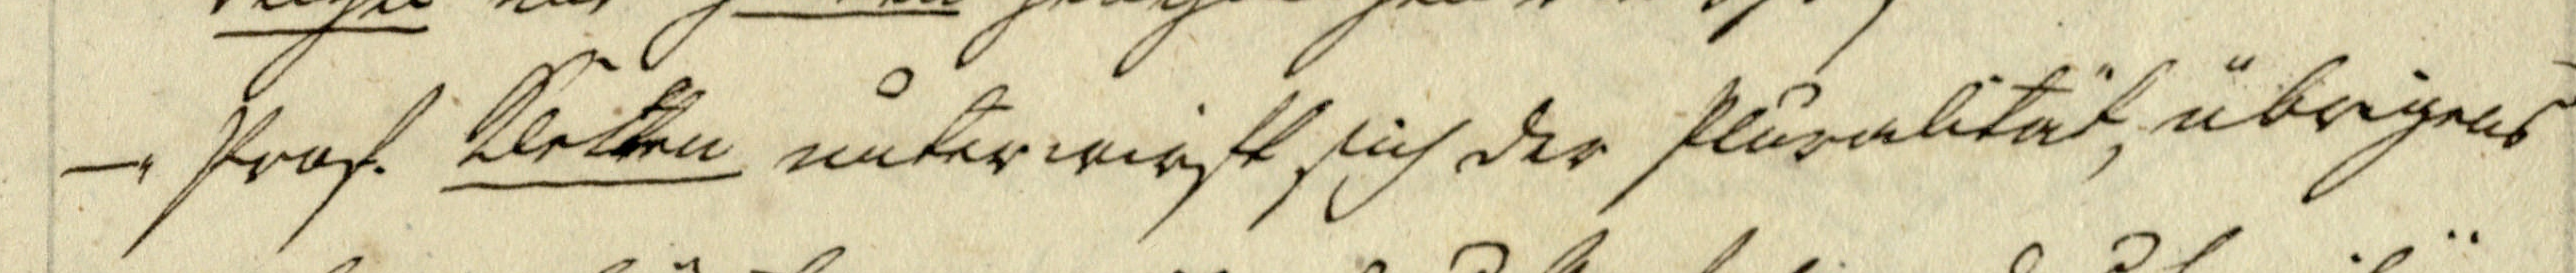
Prof. Kletten unterwirft sich der Pluralität, übrigens
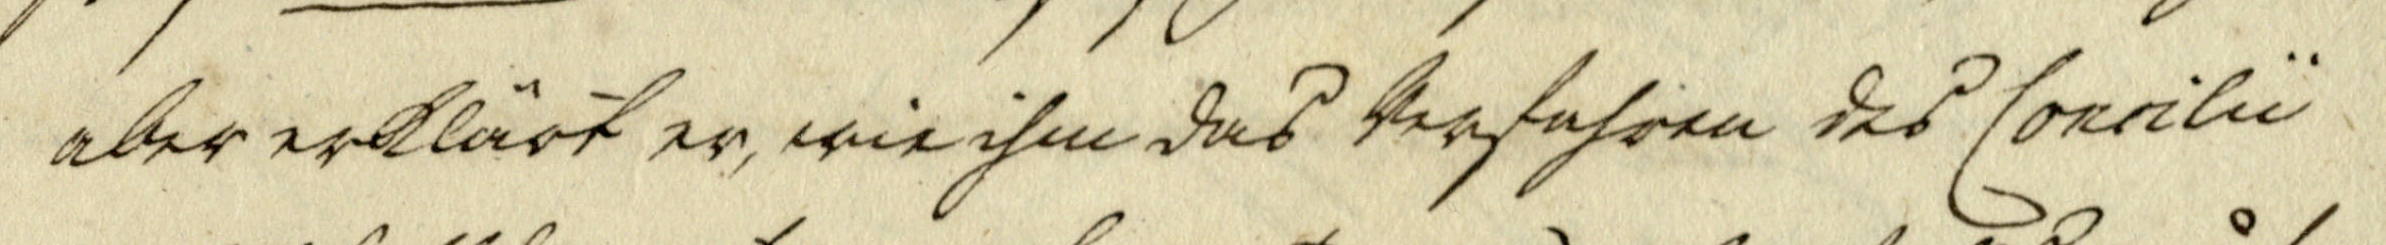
aber erklärt er, wie ihm das Verfahren des Concilii
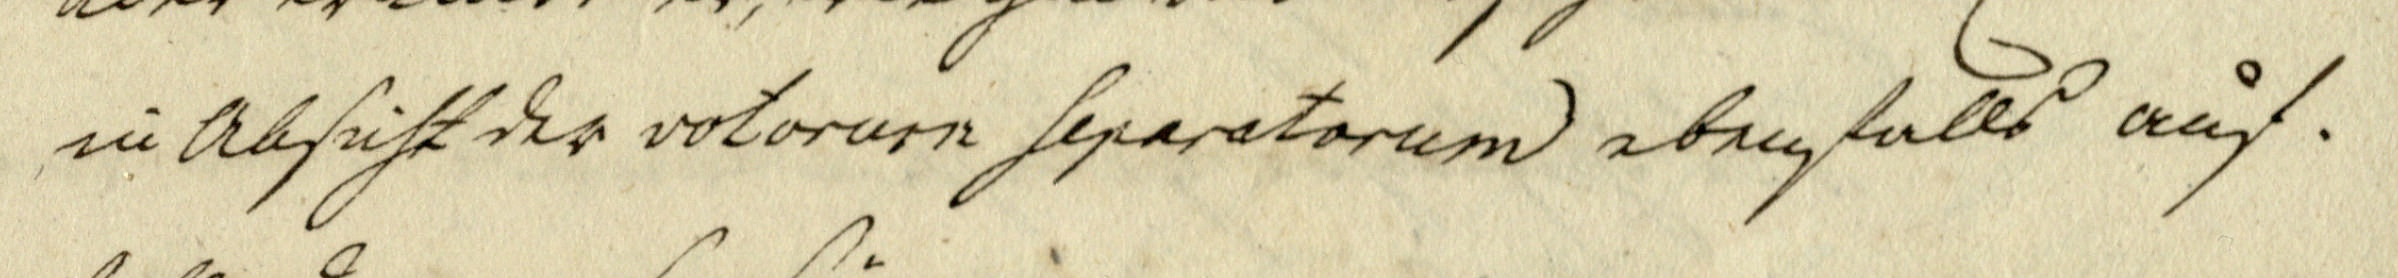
in Absicht der votorum separatorum ebenfalls auf¬
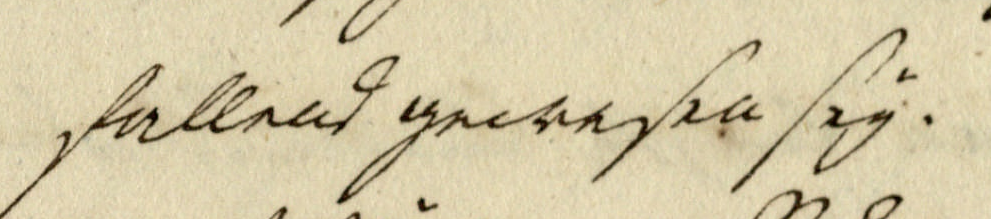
fallend gewesen seÿ.
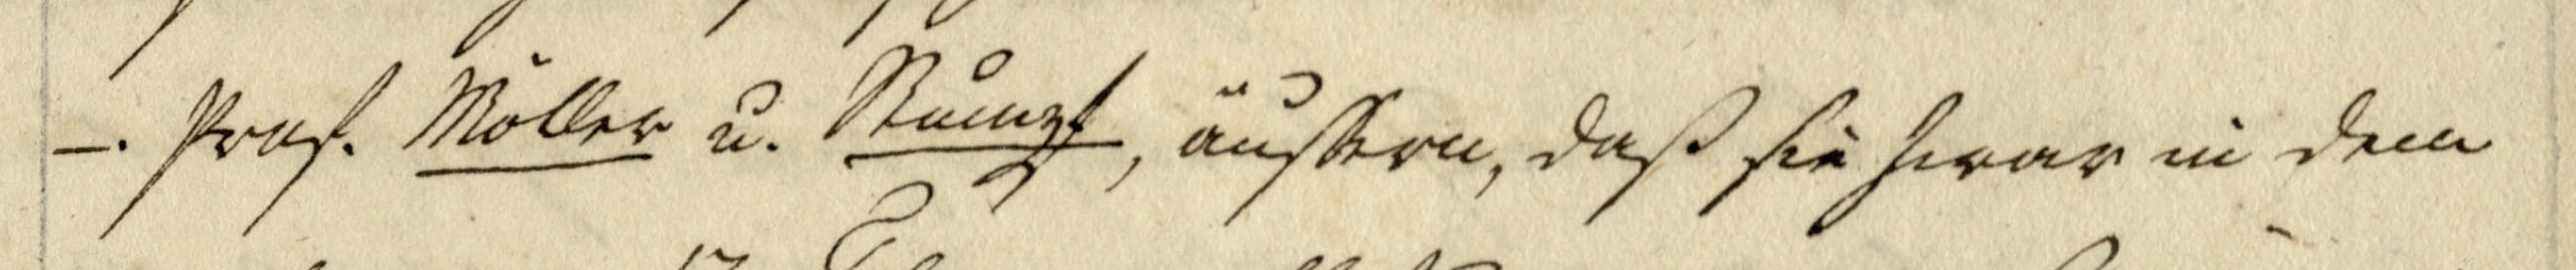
Prof. Möller u. Stumpf, äussern, daß sie zwar in dem
